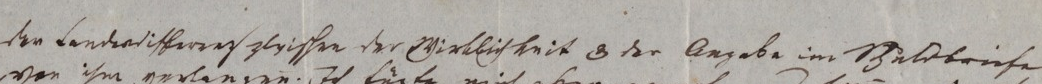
der Landesdifferenz zwischen der Wirklichkeit & der Angabe im Schuldbriefe
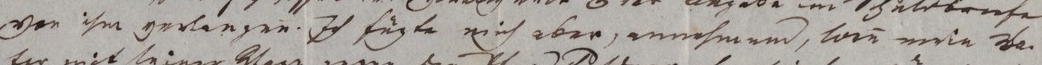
von ihm verlangen. Ich fügte mich aber, annehmend, wenn mein Va-
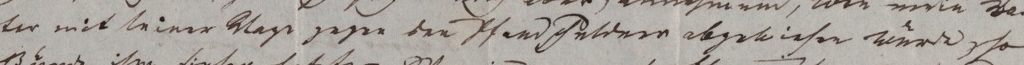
ter mit seiner Klage gegen den Pfandschuldner abgewiesen würde, so
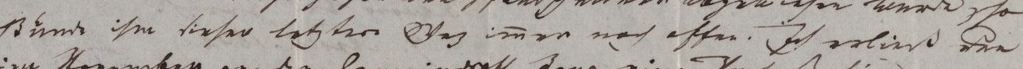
stünde ihm dieser letztere Weg immer noch offen. Ich erließ nun
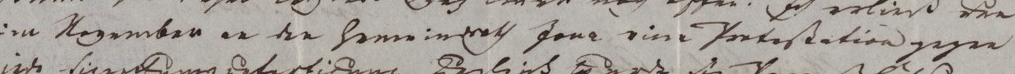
in November an den Gemeindrath Jona eine Protestation gegen
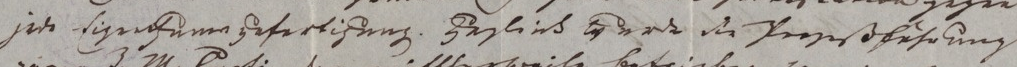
jede Eigenthumszufertigung. Zugleich wurde die Prozeßführung
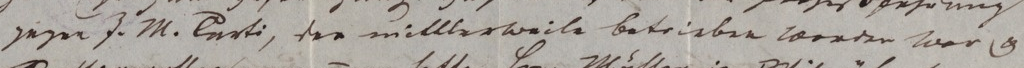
gegen J. M. Curti, der mittlerweile betrieben worden war &
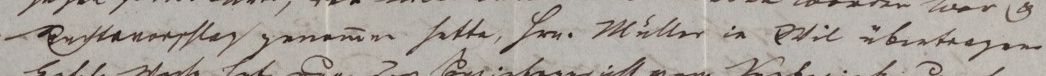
Rechtsvorschlag genommen hatte, Hrn. Müller in Wil übertragen.
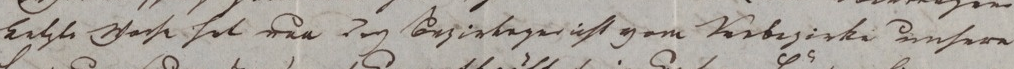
letzte Woche hat nun das Bezirksgericht vom Seebezirke unsere
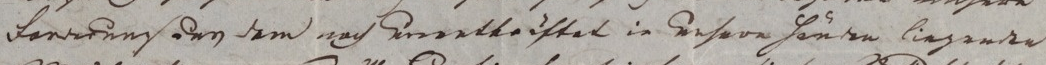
Forderung aus dem noch unentkräftetn in unsern Händen liegenden
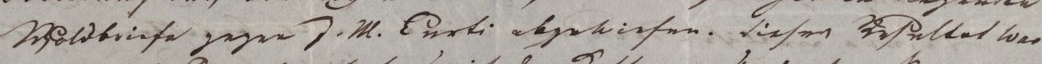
Schuldbriefe gegen J. M. Curti abgewiesen. Dieses Resultat war
